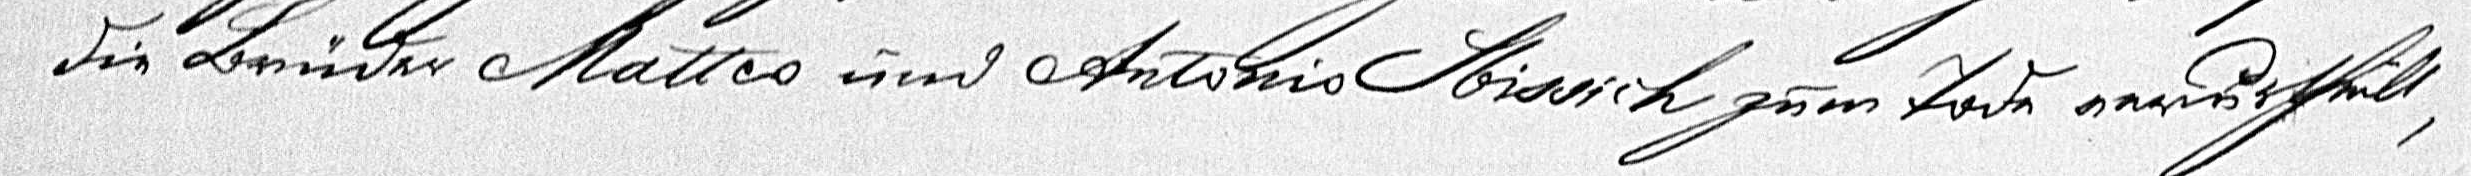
die Brüder Matteo und Antonio Sbissich zum Tode verurtheilt,
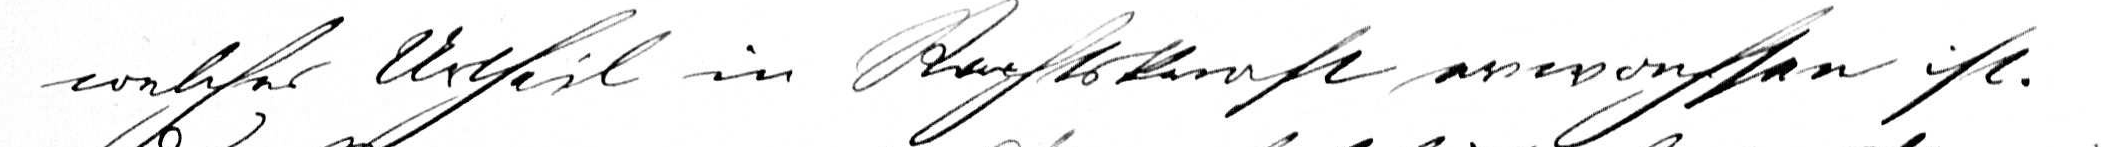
welches Urtheil in Rechtskraft erwachsen ist.
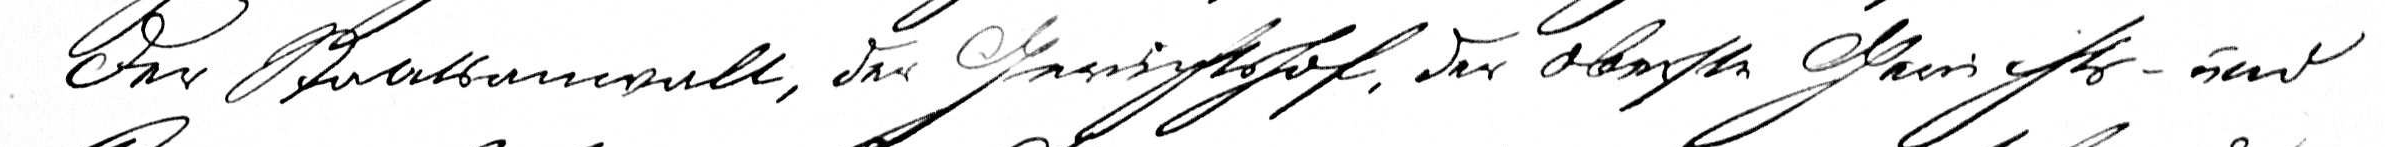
Der Staatsanwalt, der Gerichtshof, der oberste Gerichts- und
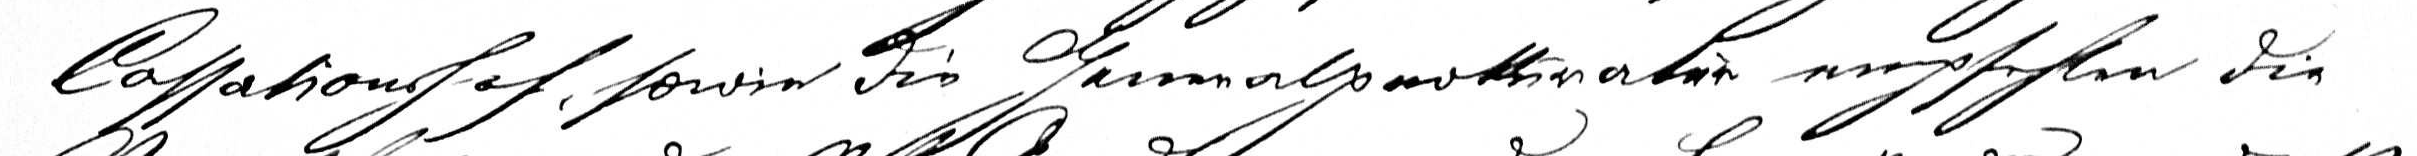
Cassationshof, sowie die Generalprokuratur empfehlen die
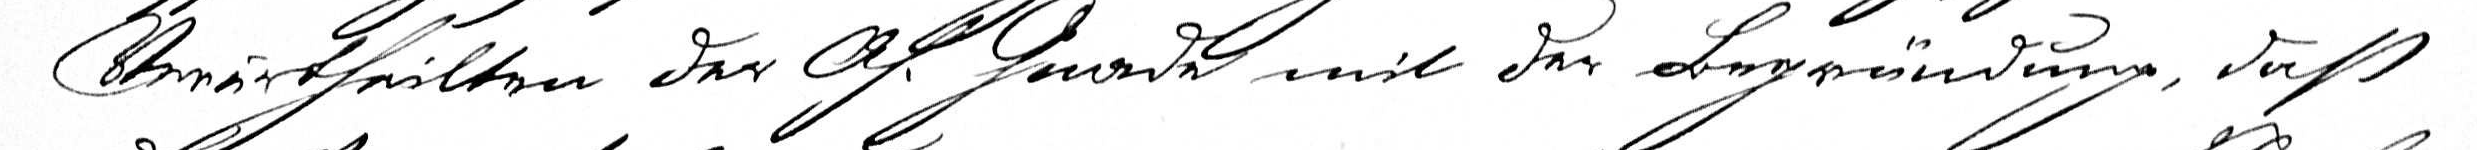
Verurtheilten der Ah. Gnade mit der Begründung, daß
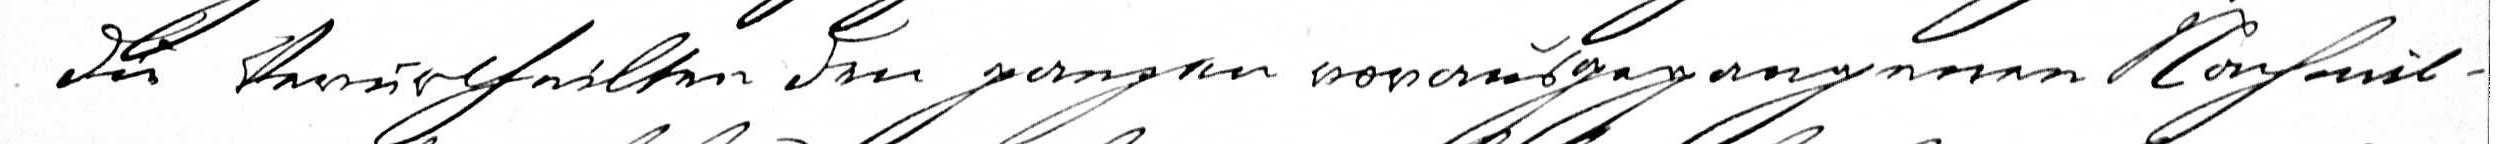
die Verurtheilten den ganzen vorausgegangenen Nachmit¬
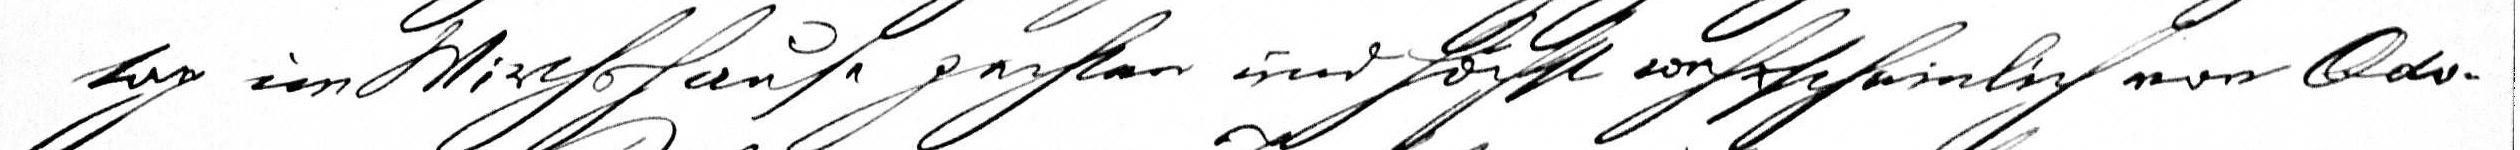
tag im Wirthshause zechen und höchst wahrscheinlich von Odo¬
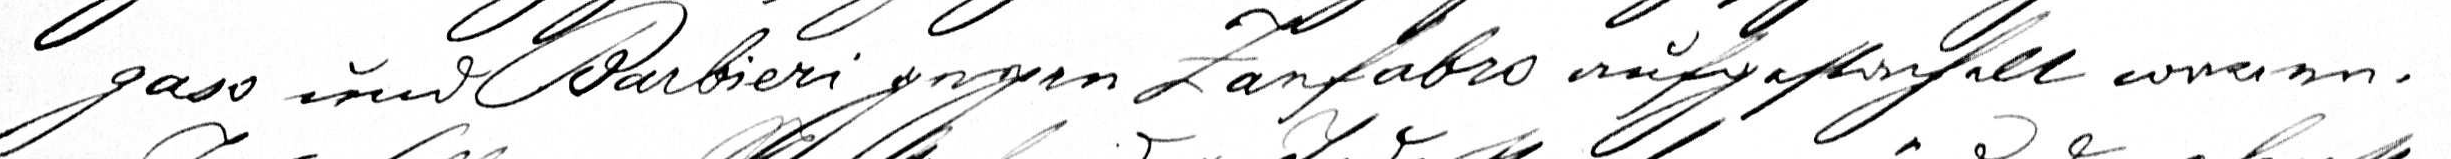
gaso und Barbieri gegen Zanfabro aufgestachelt waren.
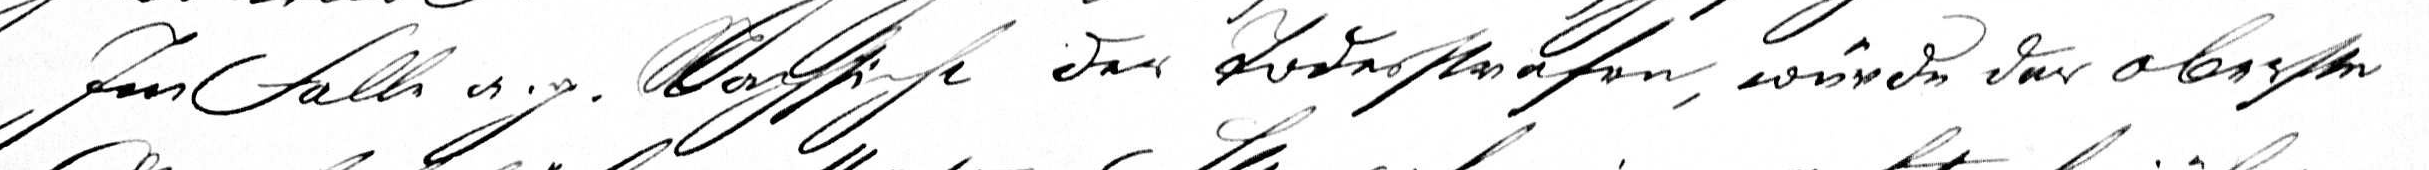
Im Falle a.g. Nachsicht der Todesstrafen, wurde der oberste
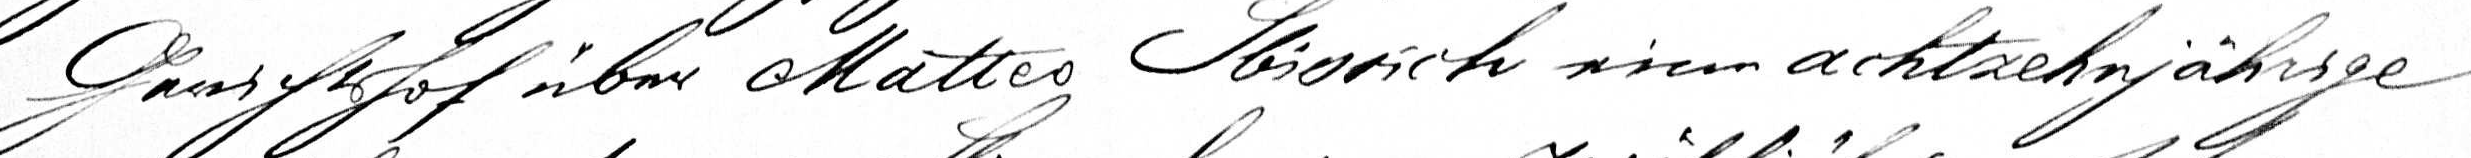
Gerichtshof über Matteo Sbissich eine achtzehnjährige
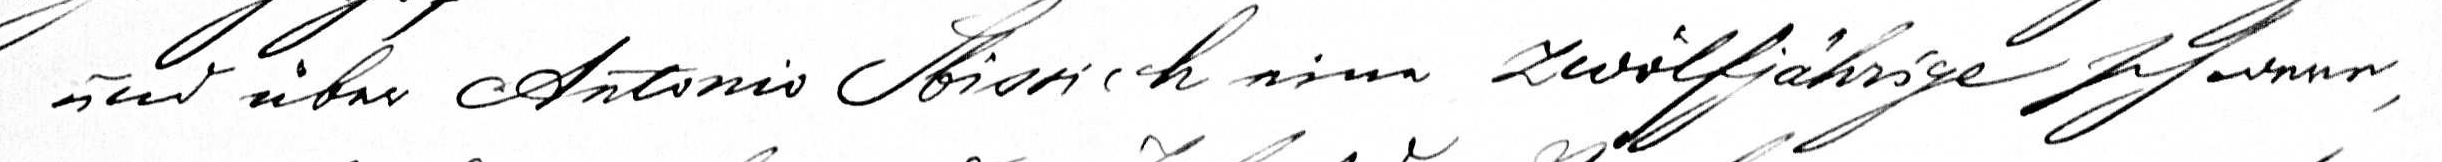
und über Antonio Sbissich eine zwölfjährige schwere,
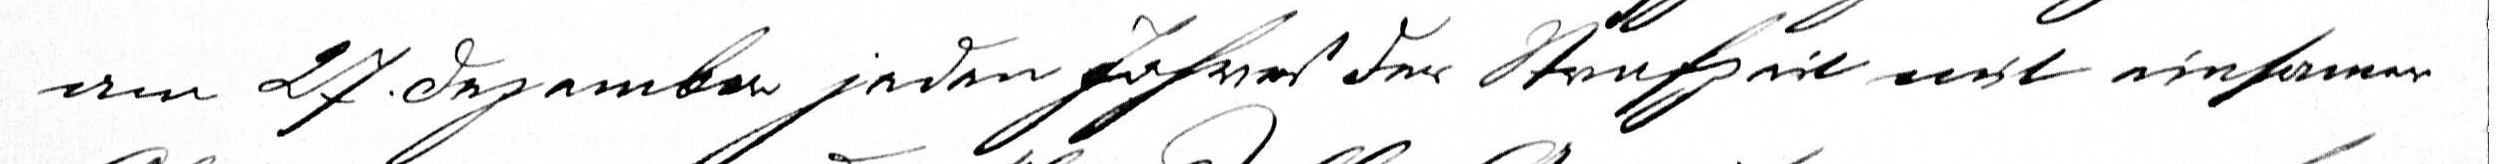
am 27. Dezember jeden Jahres der Strafzeit mit einsamer
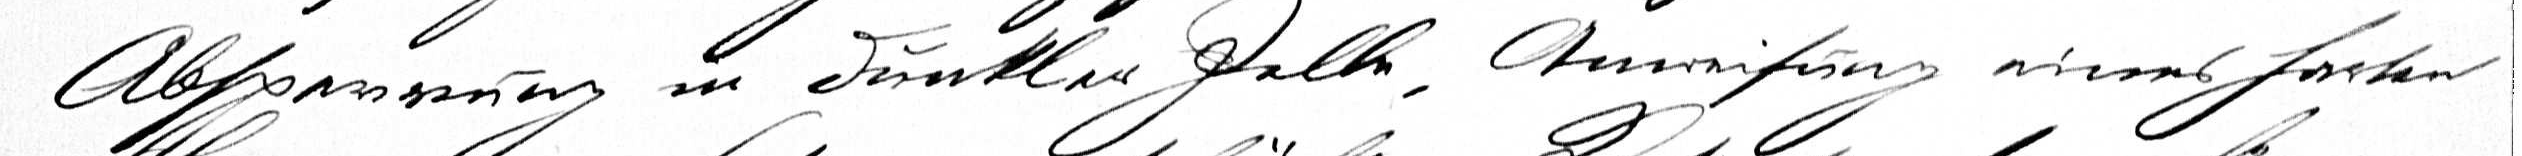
Absperrung in dunkler Zelle, Anweisung eines harten
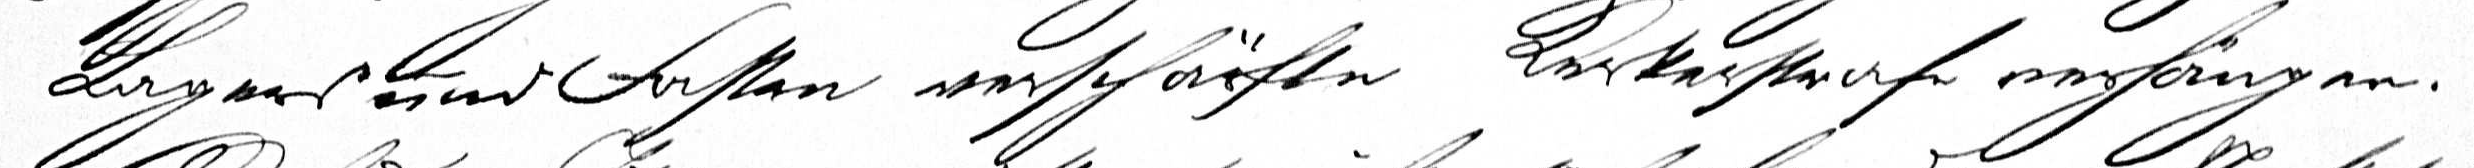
Lagers und Fasten verschärften Kerkerstrafe verhängen.
